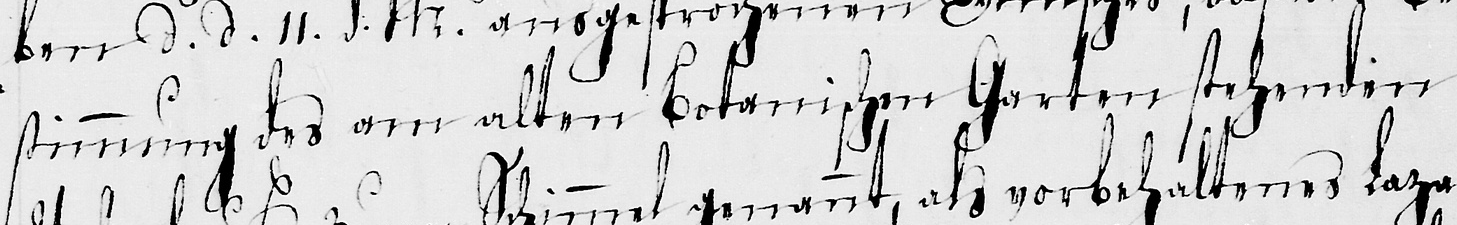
stimmung des am alten Botanischen Garten stehenden
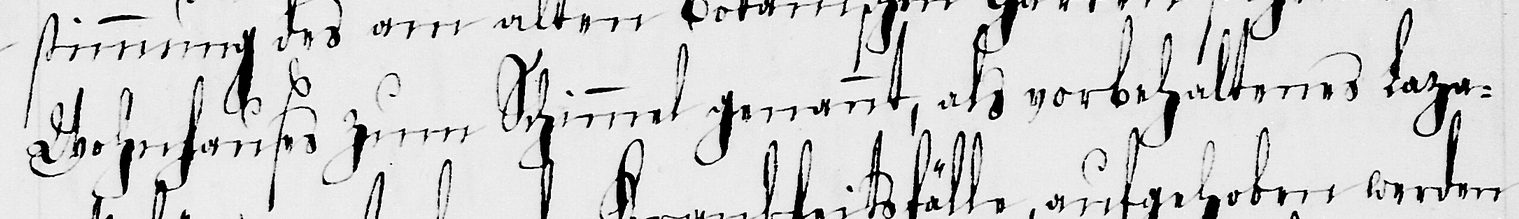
Wohnhauses[,] zum Schimmel genannt, als vorbehaltenes Laza¬
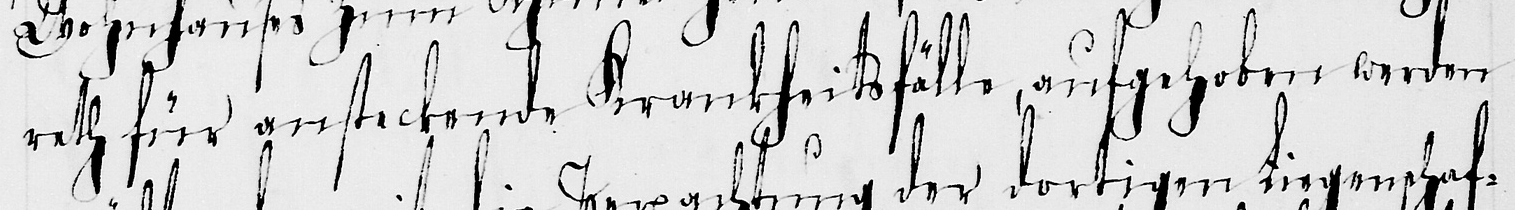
reth für ansteckende Krankheitsfälle, aufgehoben werden
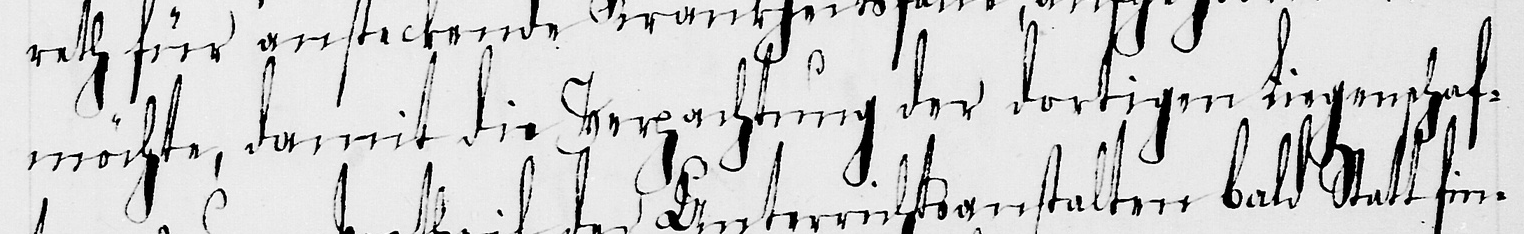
möchte, damit die Verpachtung der dortigen Liegenschaf¬
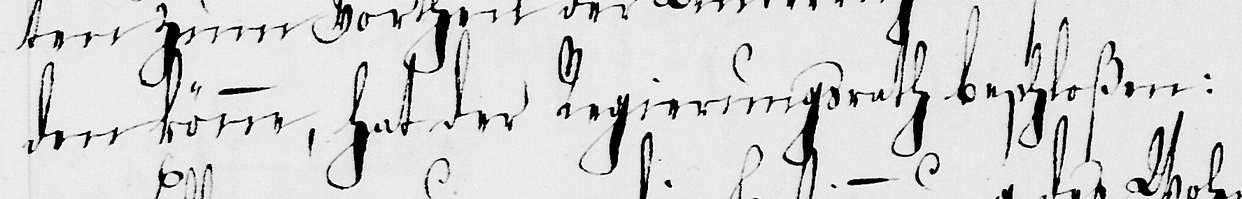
den könne, hat der Regierungsrath beschloßen:
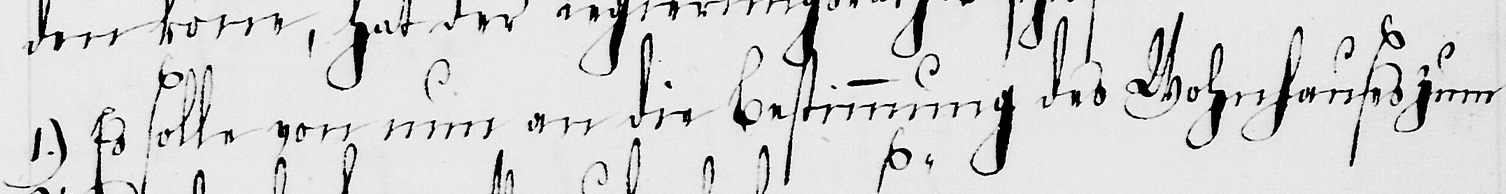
1.) Es solle von nun an die Bestimmung des Wohnhauses zum
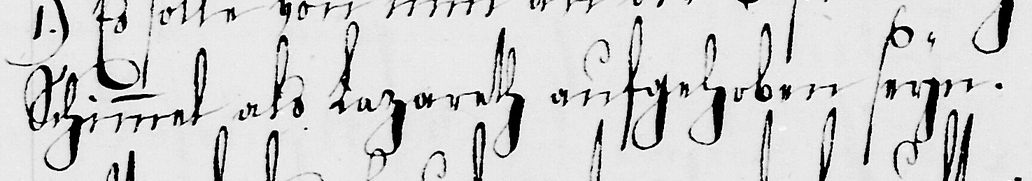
Schimmel als Lazareth aufgehoben seyn.
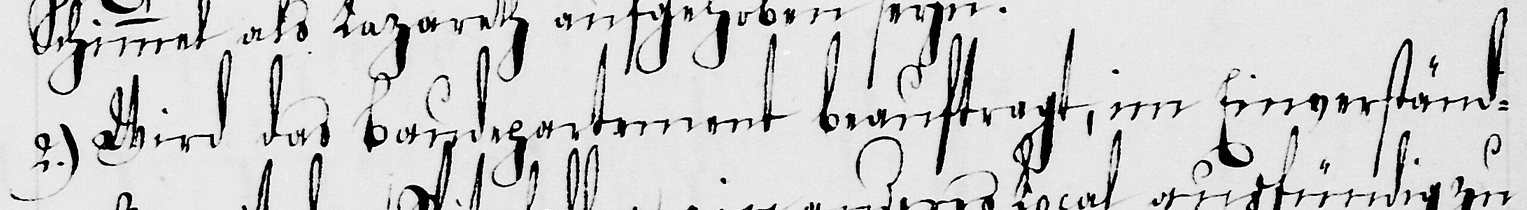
2.) Wird das Baudepartement beauftragt, im Einverständ¬
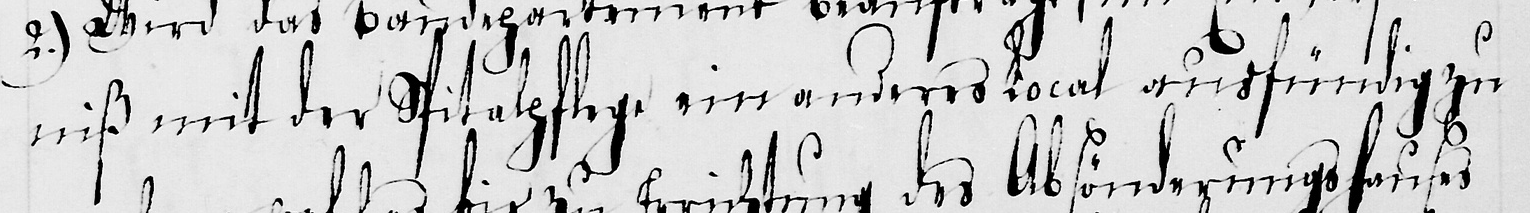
niß mit der Spitalpflege ein anderes Local ausfündig zu
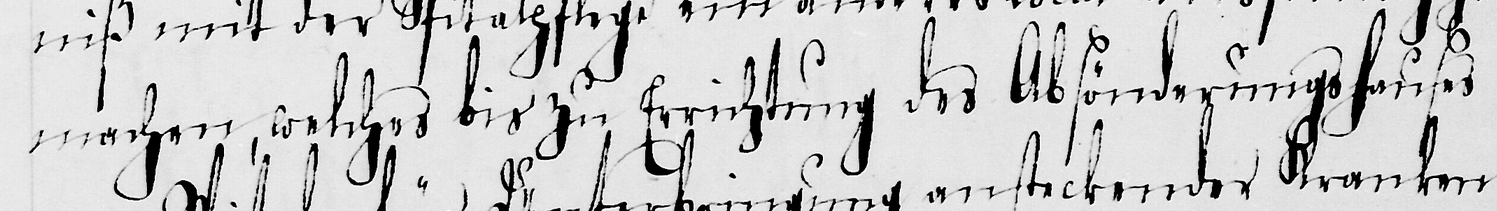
machen, welches bis zu Errichtung des Absönderungshauses
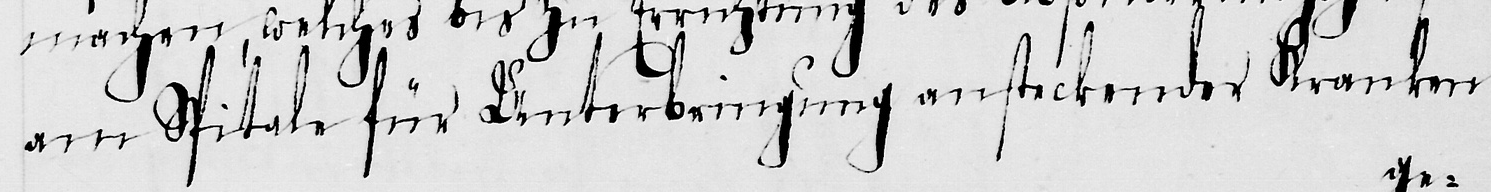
am Spitale für Unterbringung ansteckender Kranken
